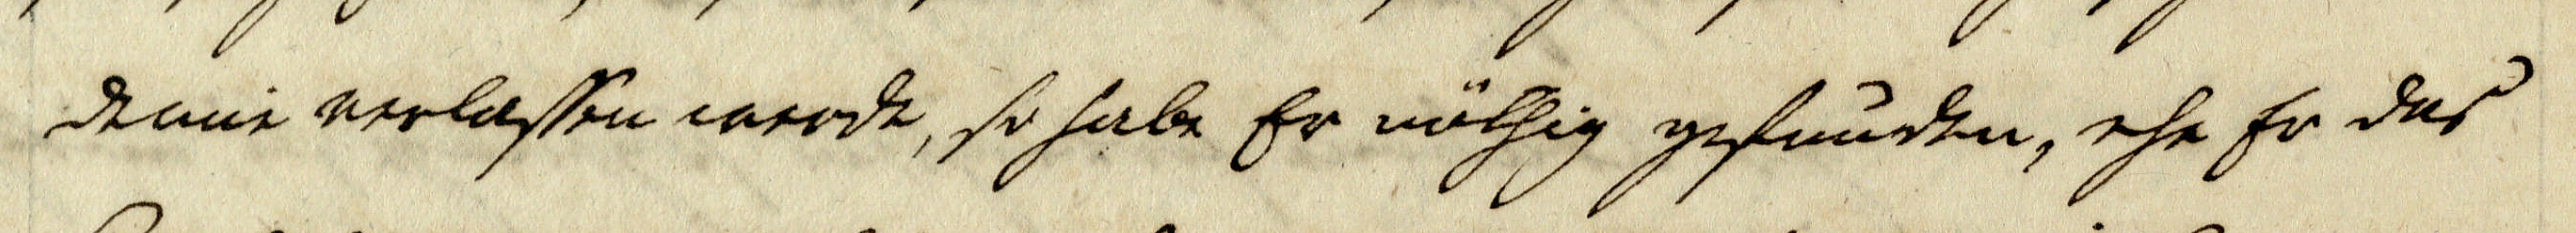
demie verlassen werde, so habe Er nöthig gefunden, ehe Er das
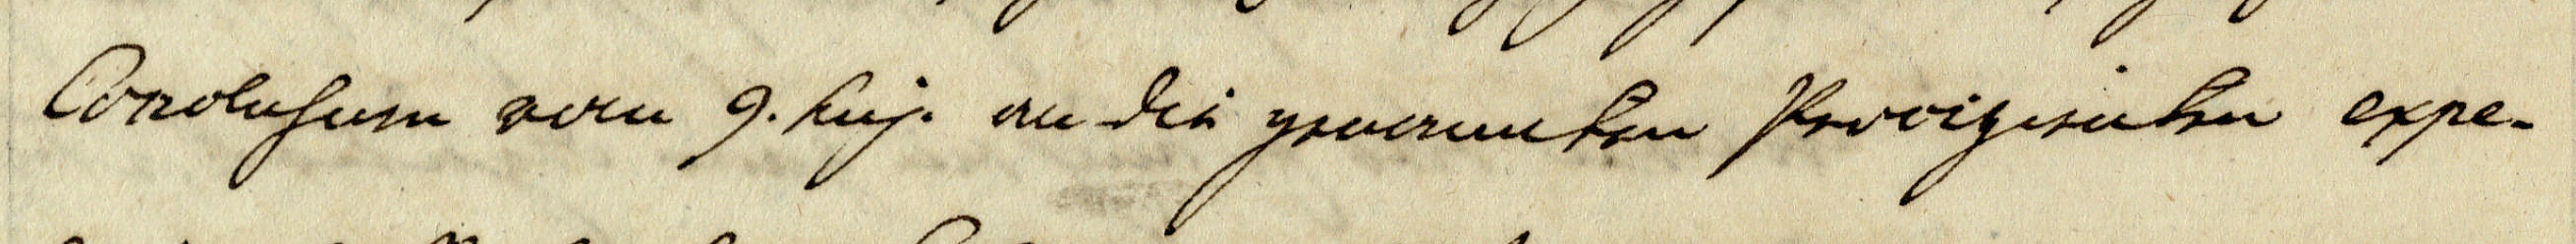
Conclusum vom 9 huj. an die genannten Percipienten expe¬
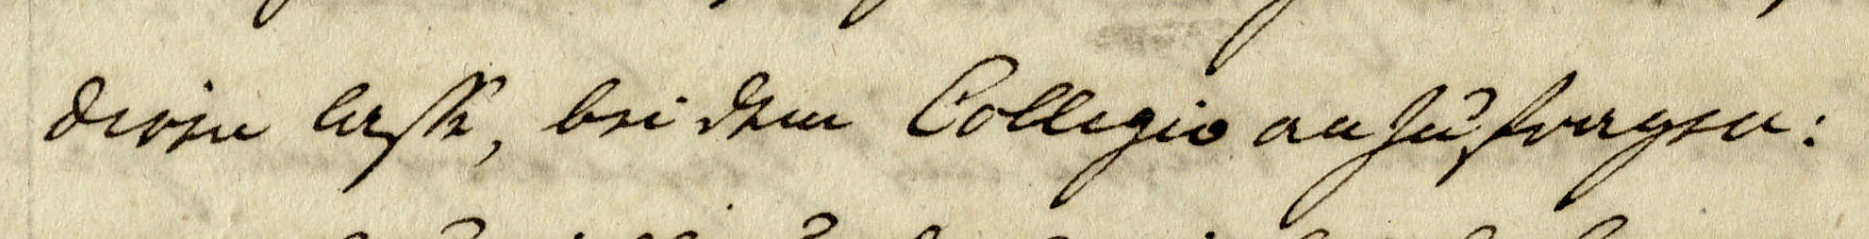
diren lasse, bei dem Collegio anzufragen:
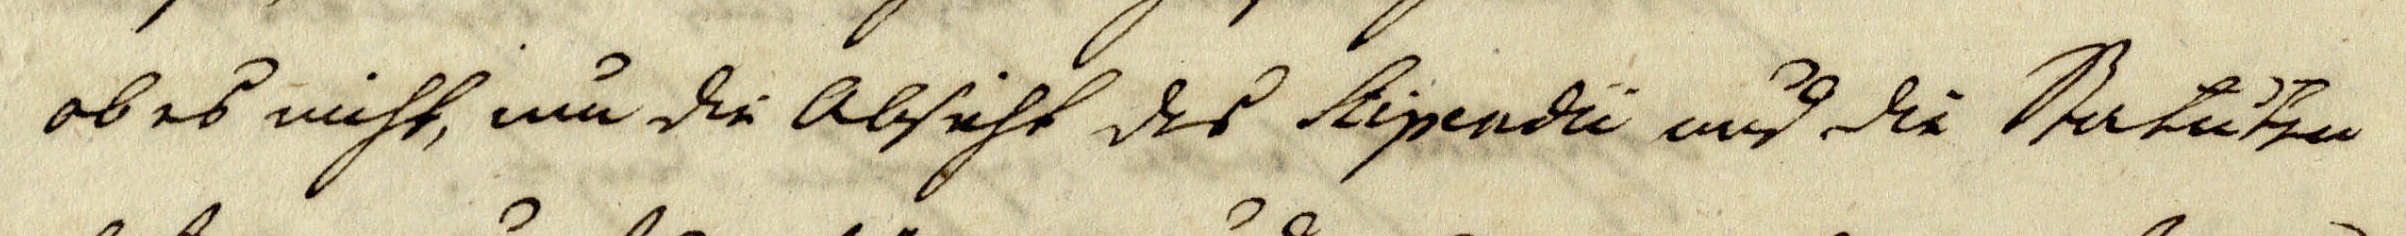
ob es nicht, um die Absicht des Stipendii und die Statuten
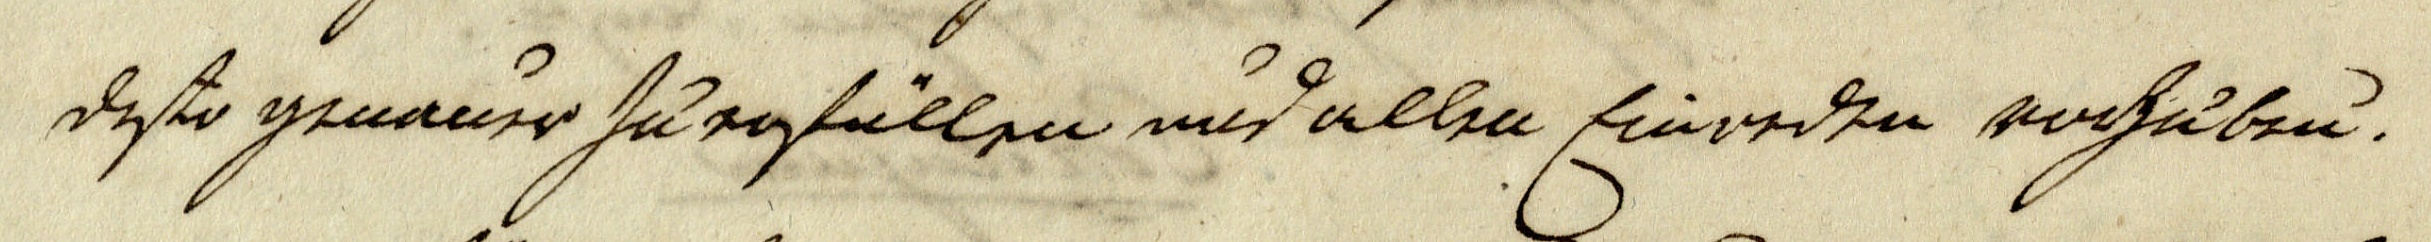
desto genauer zu erfüllen und allen Einreden vorzubeu¬
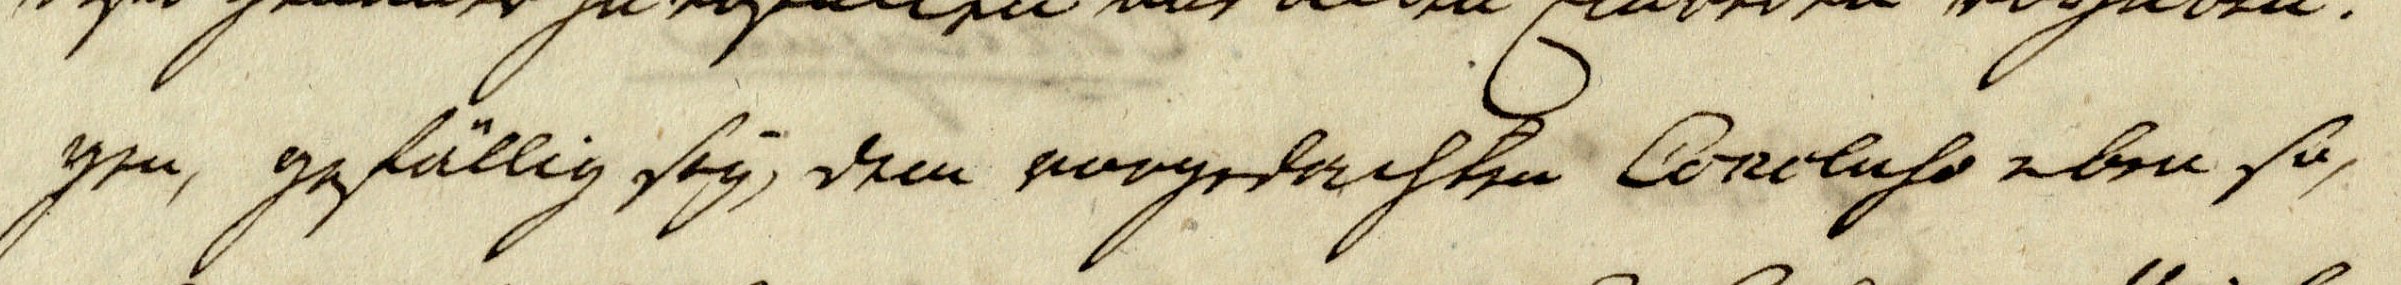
gen, gefällig seÿ, dem vorgedachten Concluso eben so,
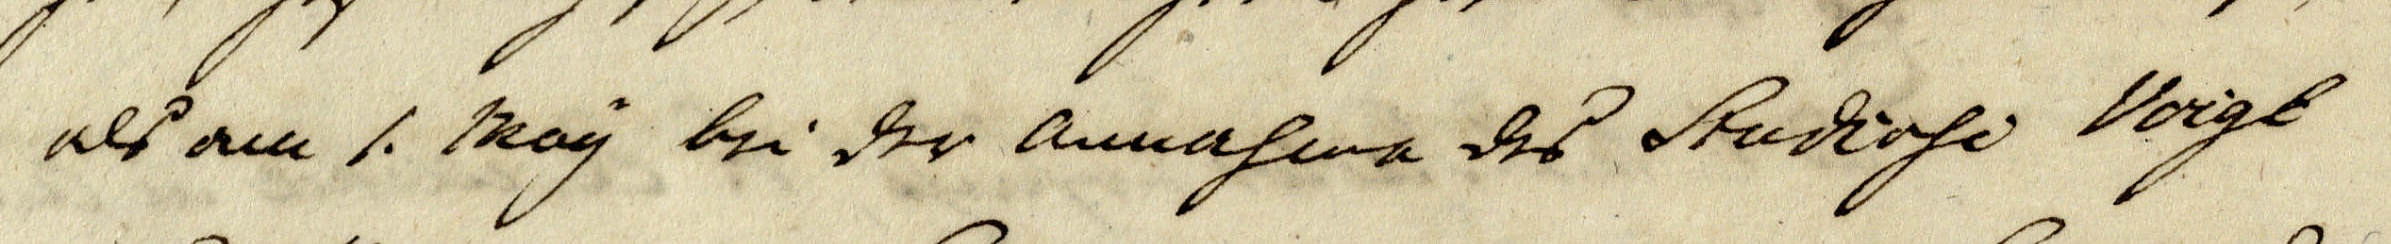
als am 1. Maÿ bei der Annahme des Studiosi Voigt
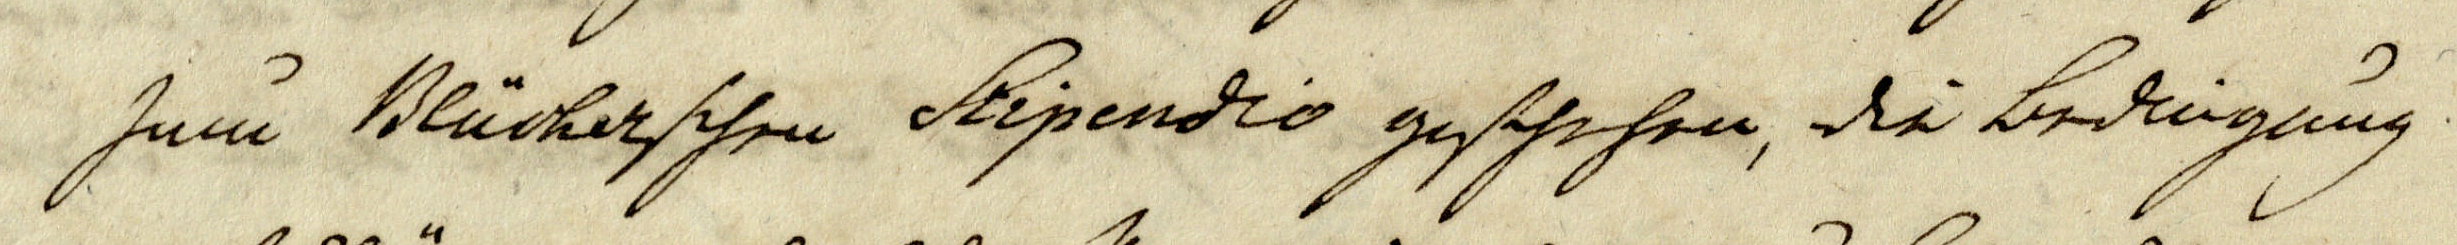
zum Blücherschen Stipendio geschehen, die Bedingung
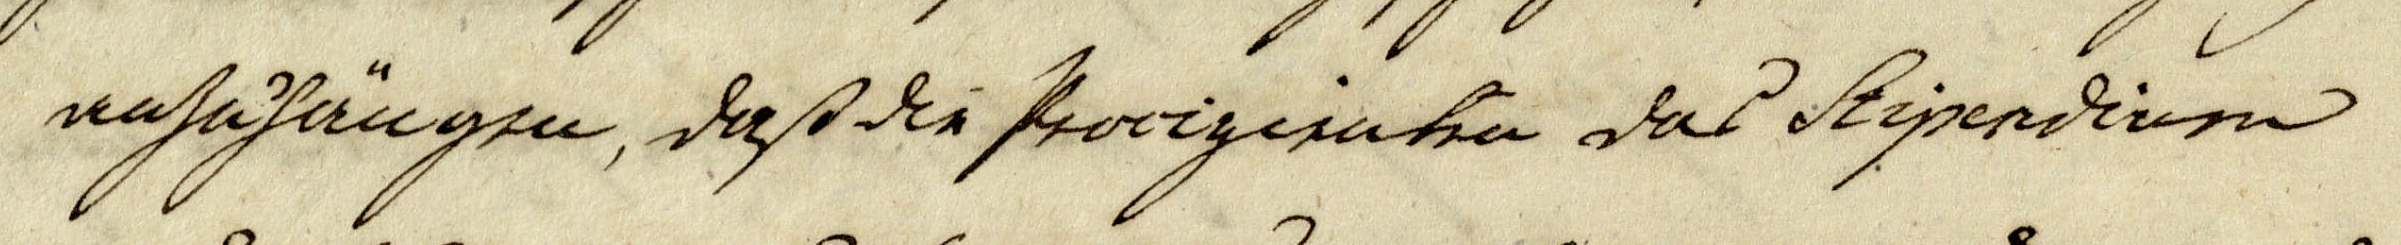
anzuhängen, daß die Percipienten das Stipendium
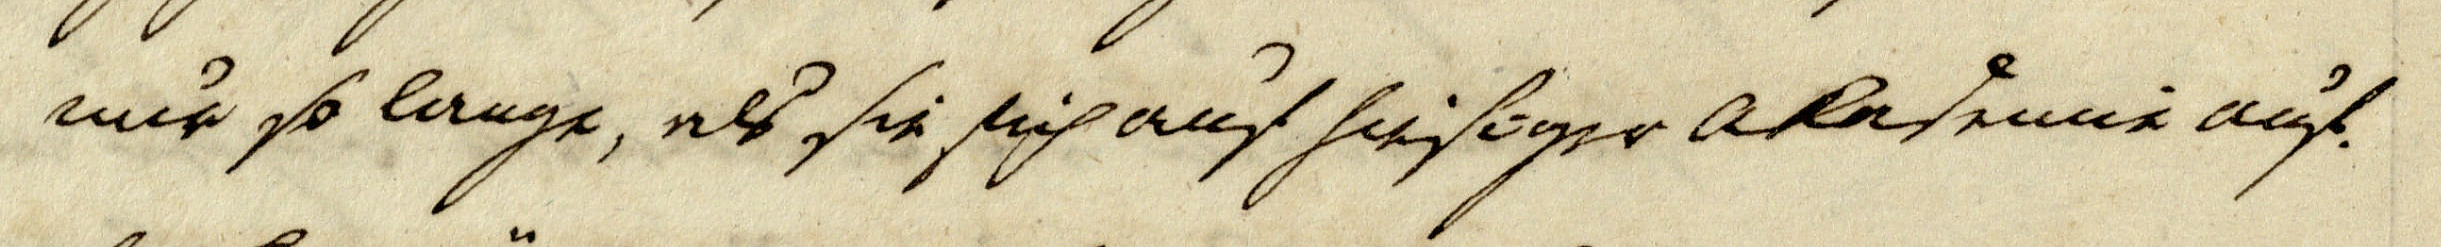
zur so lange, als sie sich auf hiesiger Akademie auf¬
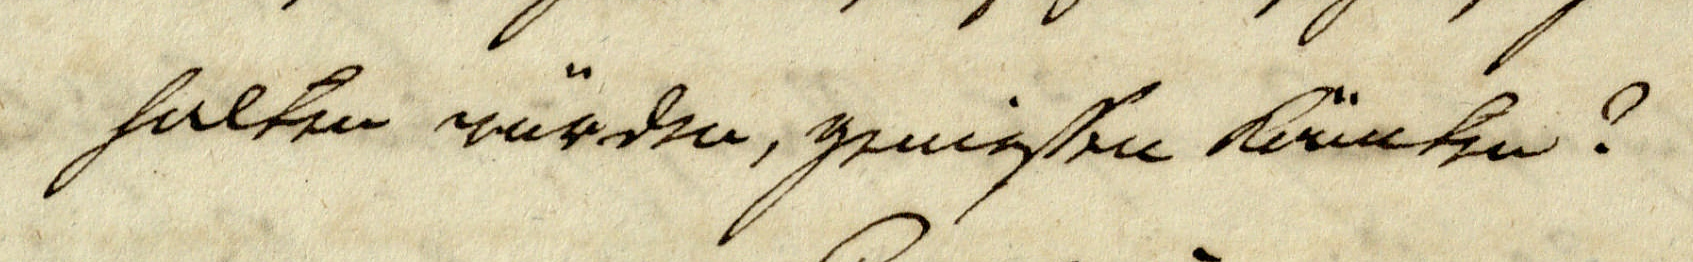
halten würden, geniessen könnten?
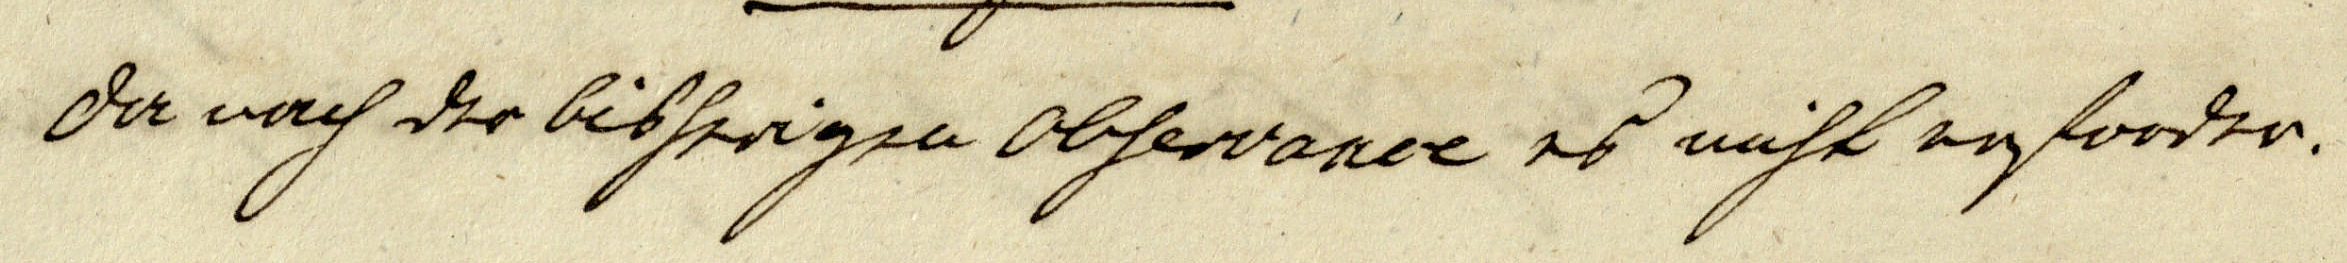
Da nach der bisherigen Observance es nicht erforder¬
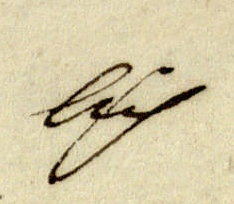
lich
